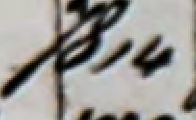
78/4
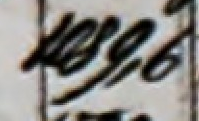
1089,6
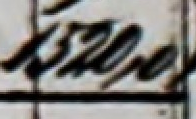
1520,0
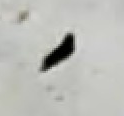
„
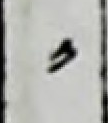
„
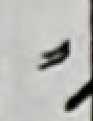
„
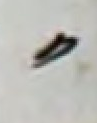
„
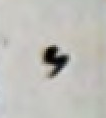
„
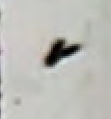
„
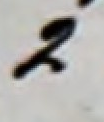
2
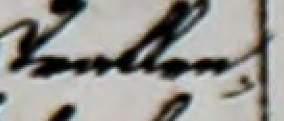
Tratten„
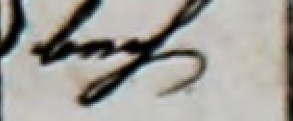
bach
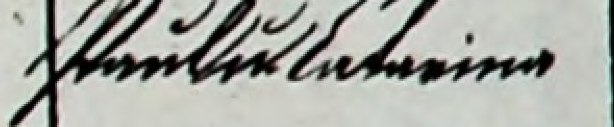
Paul u. Catarina
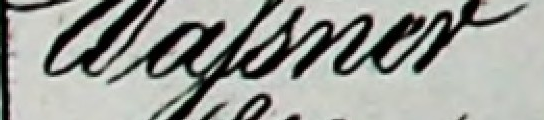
Wassner
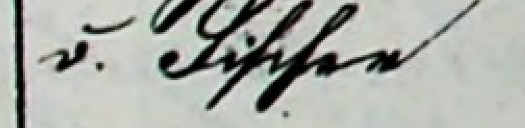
v. Fischer
